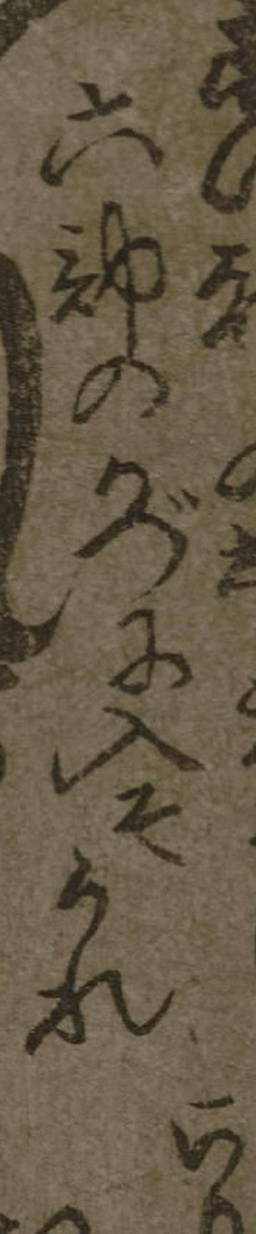六部のかづに入そうれ
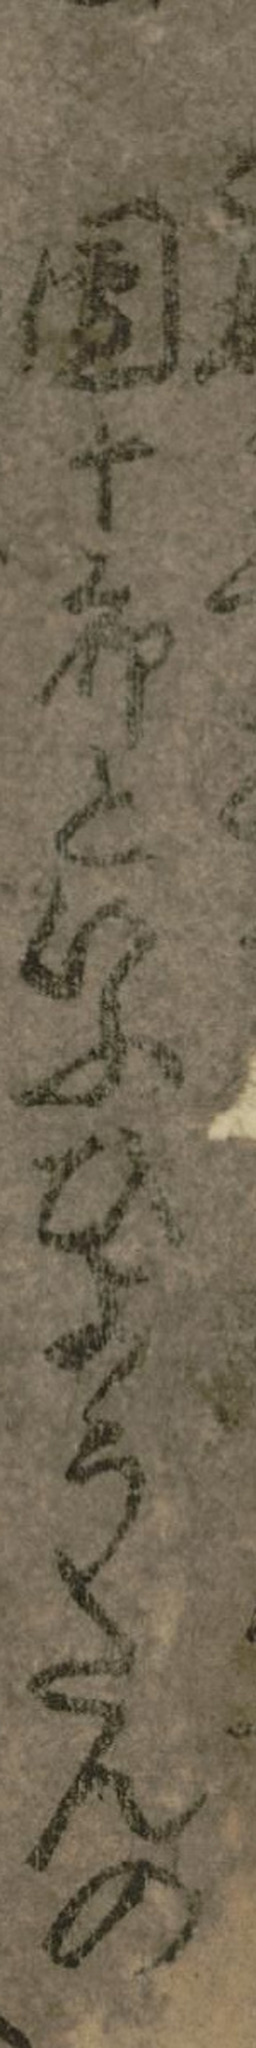団十郎といふひょうたんの
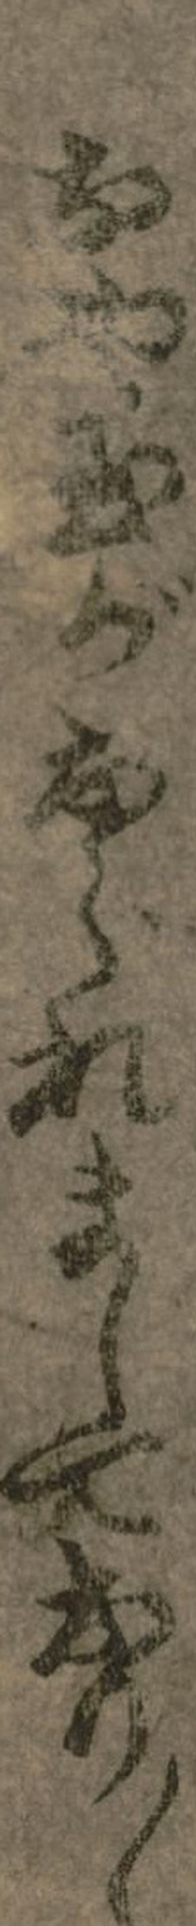おや玉がおられましており〳〵
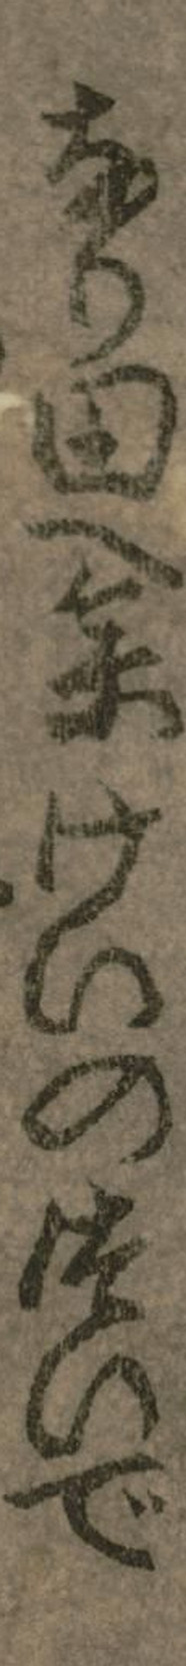なり田へ参けいのついで
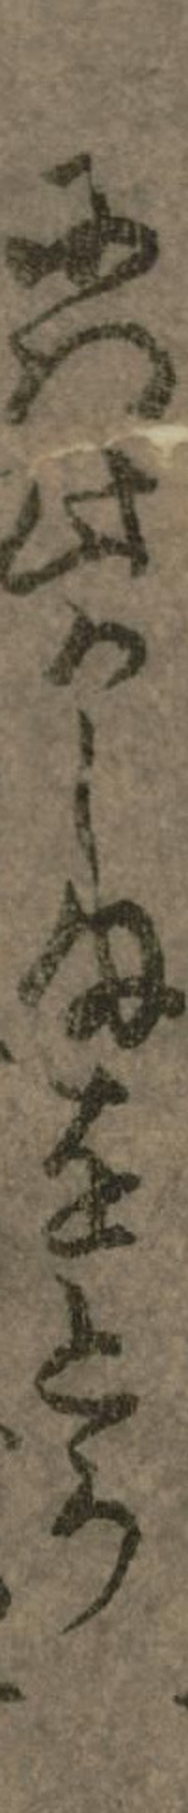には此かしまをとう
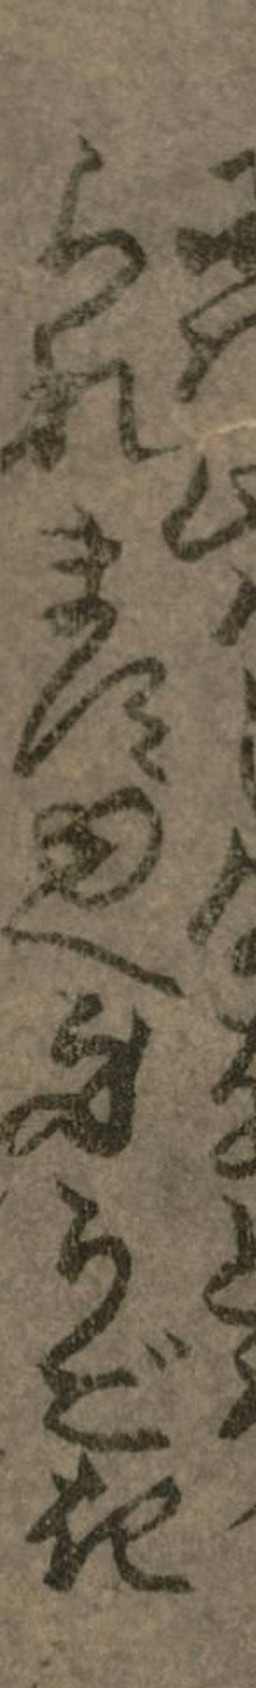られますゆへ身うごき
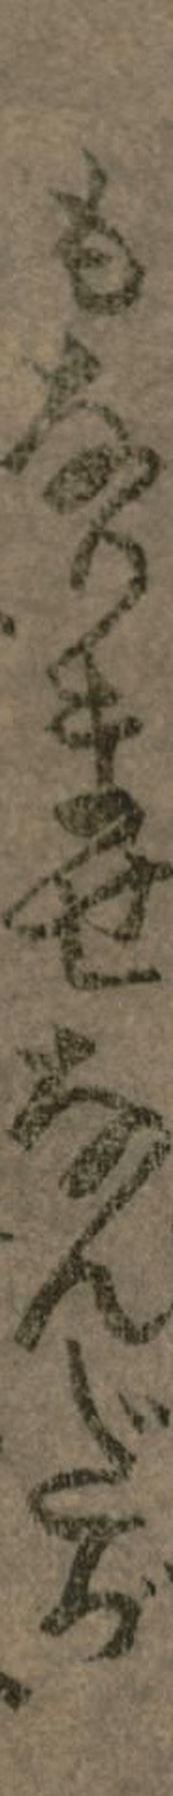もなりませなんだが
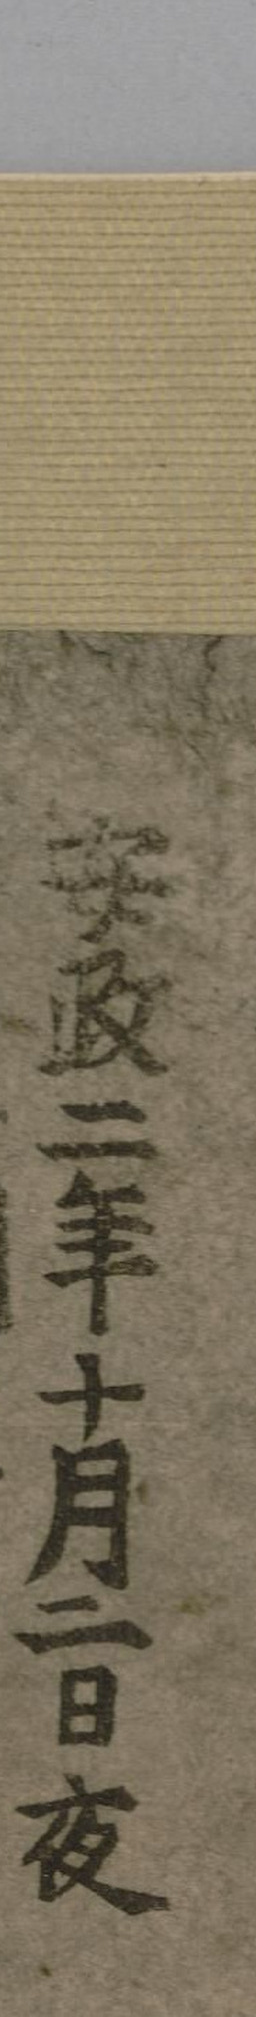安政二年十月二日夜
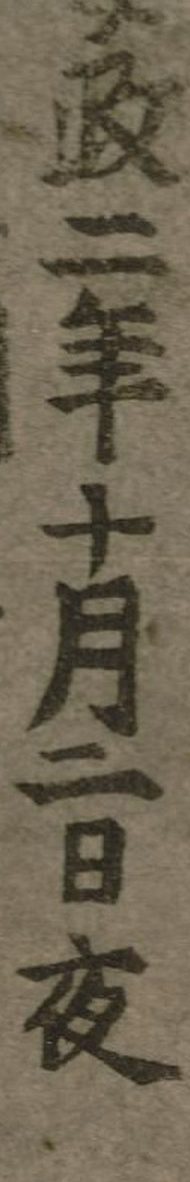安政二年十月二日夜
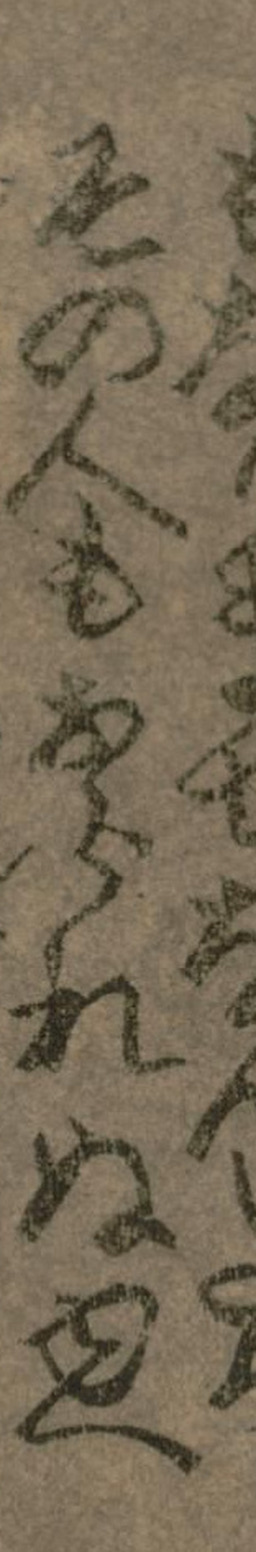その人もおられぬゆへ
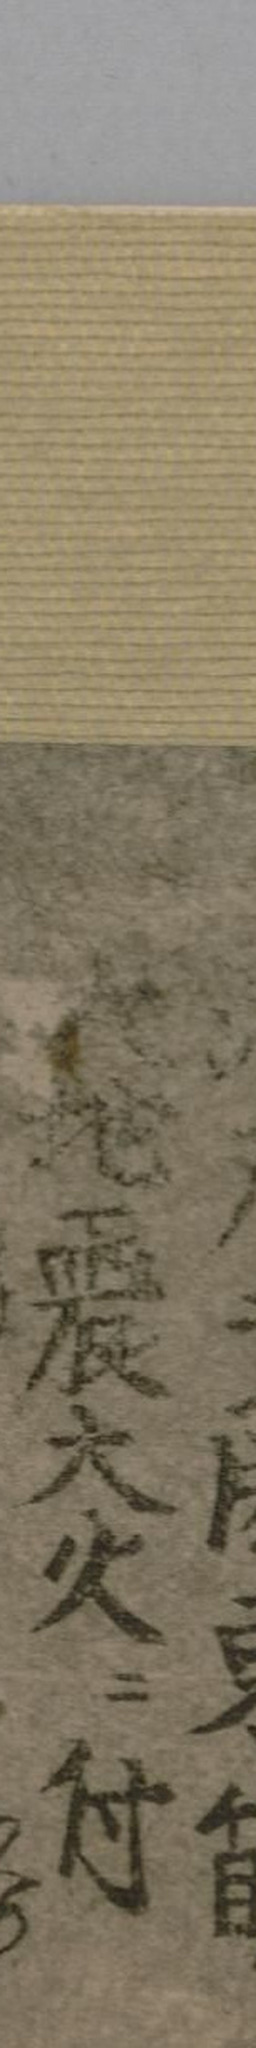大地震大火に付
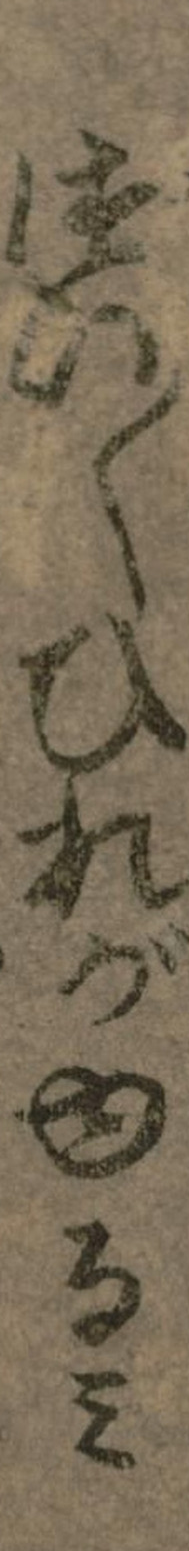つい〳〵ひれがゆるみ
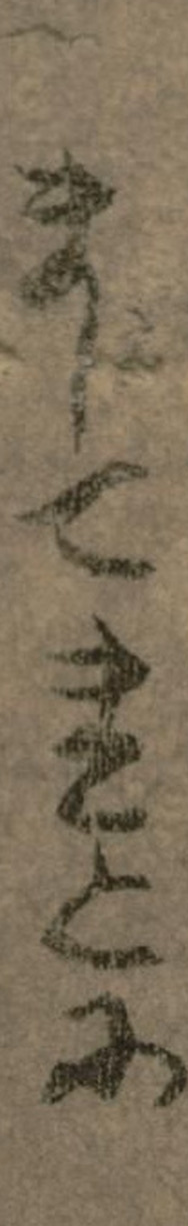ましてまことに
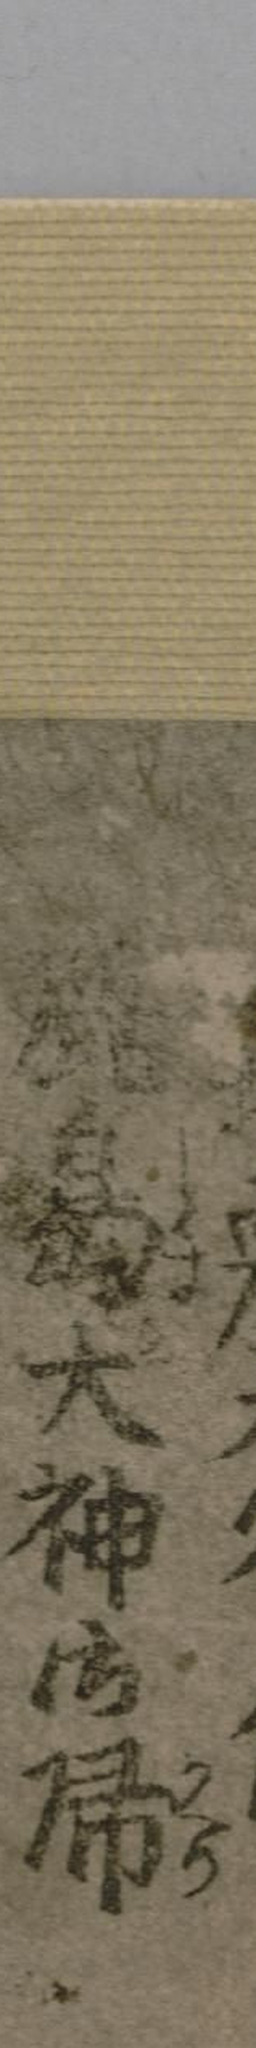鹿島大神御帰
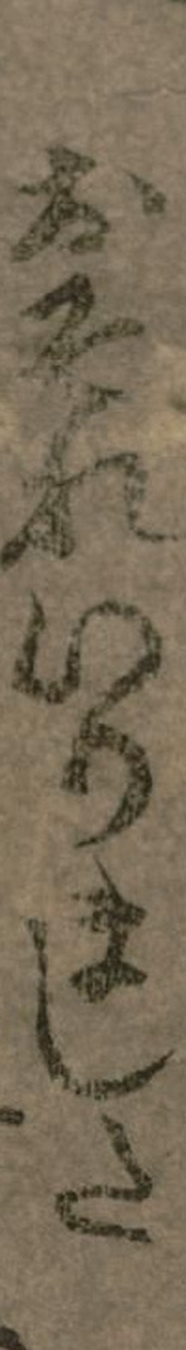おそれいりました
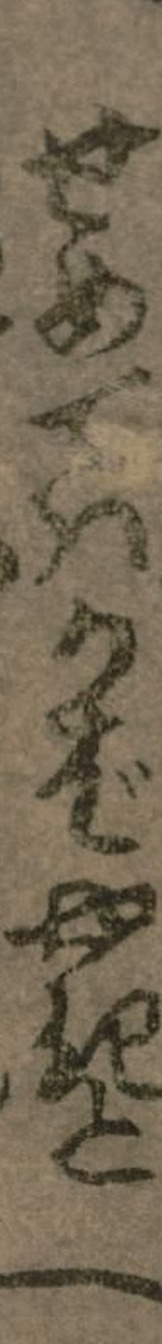せめてはかばやきと
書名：[すい神のおしえにいのちたすかりて]
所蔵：東京大学地震研究所図書室 Earthquake Research Institute Library, The University of Tokyo, JAPAN
